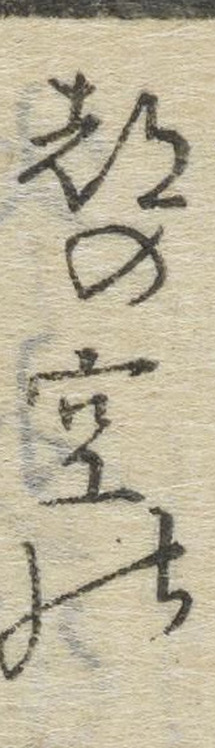都の空の
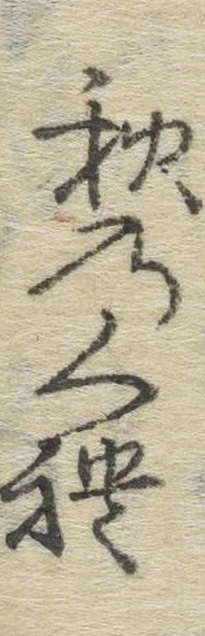秋のくれ
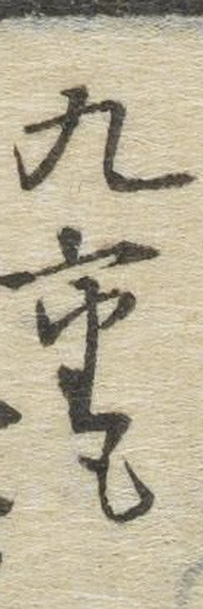九重も
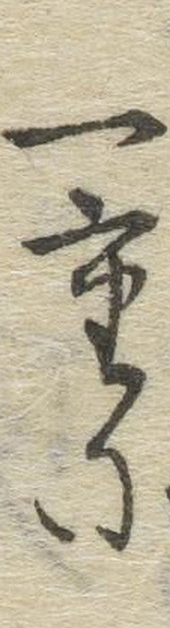一重に
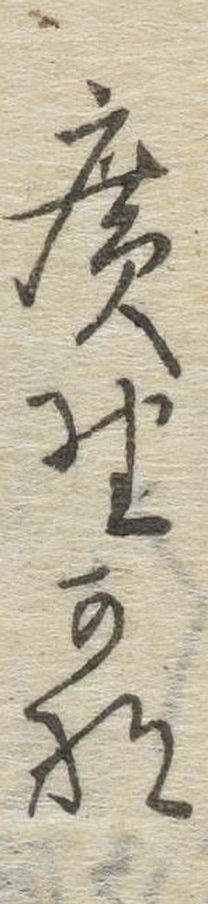広野かな
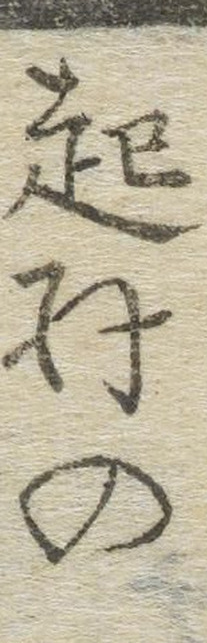起臥の
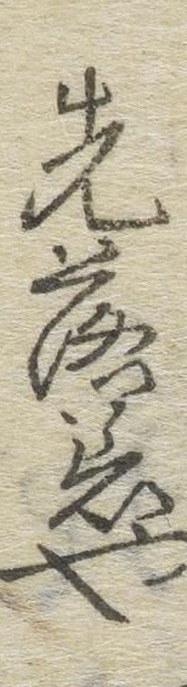先落着や

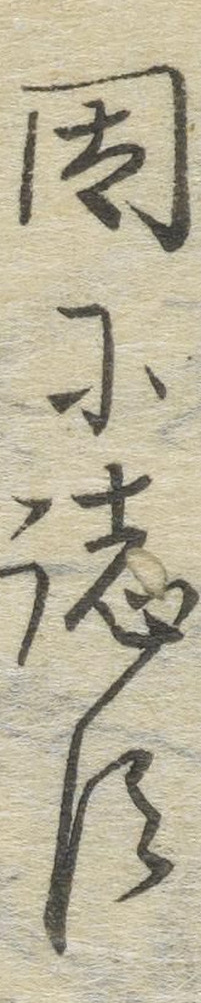因に誌す
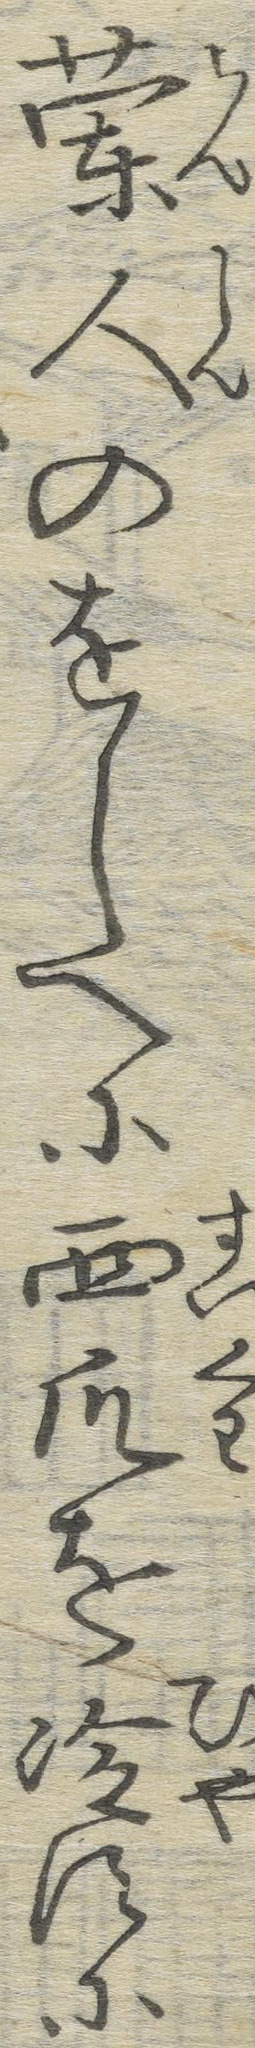蘭人のをしへに西瓜を冷すに
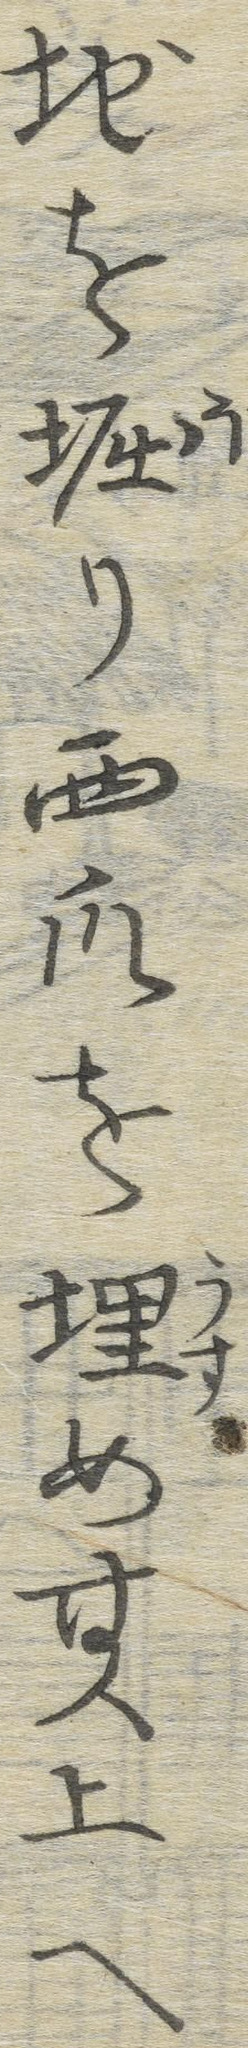地を掘り西瓜を埋め其上へ
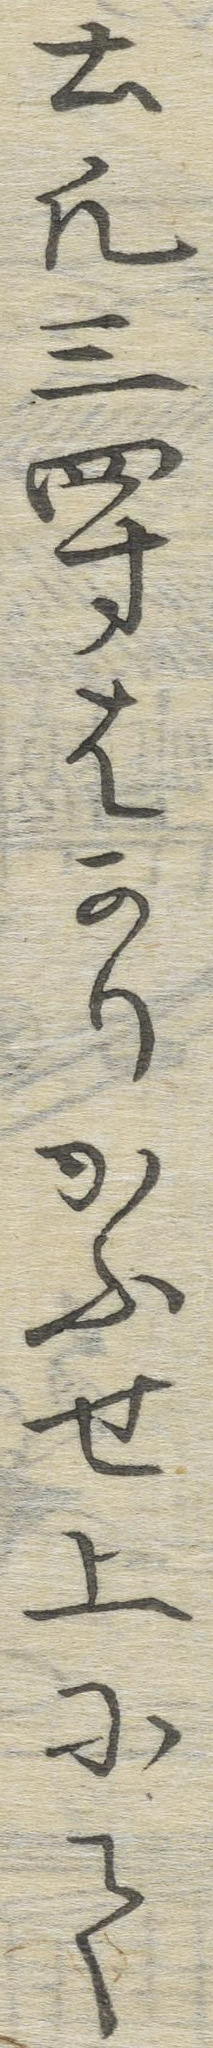土凡三四寸はかりかふせ上にて
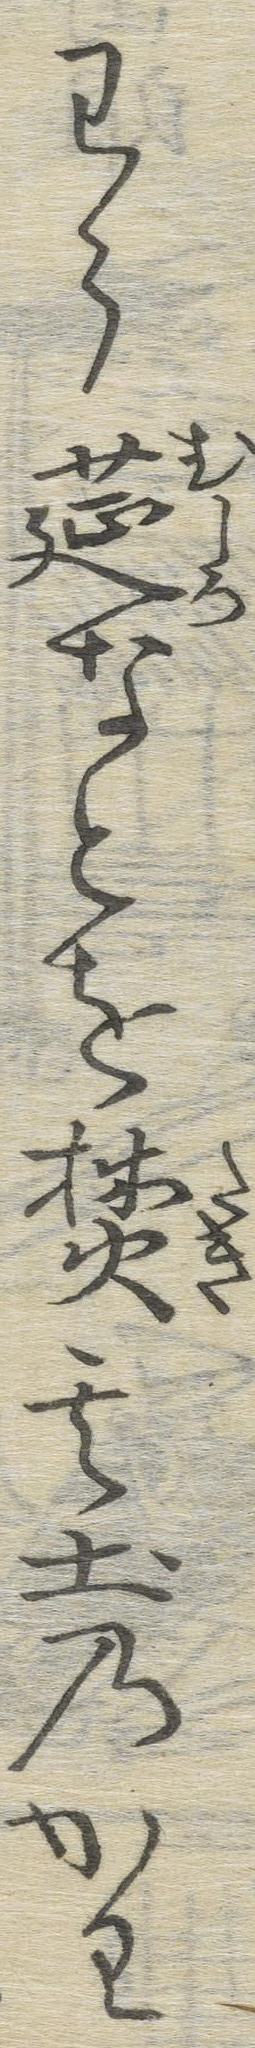わら莚なとを焚其土のかわ
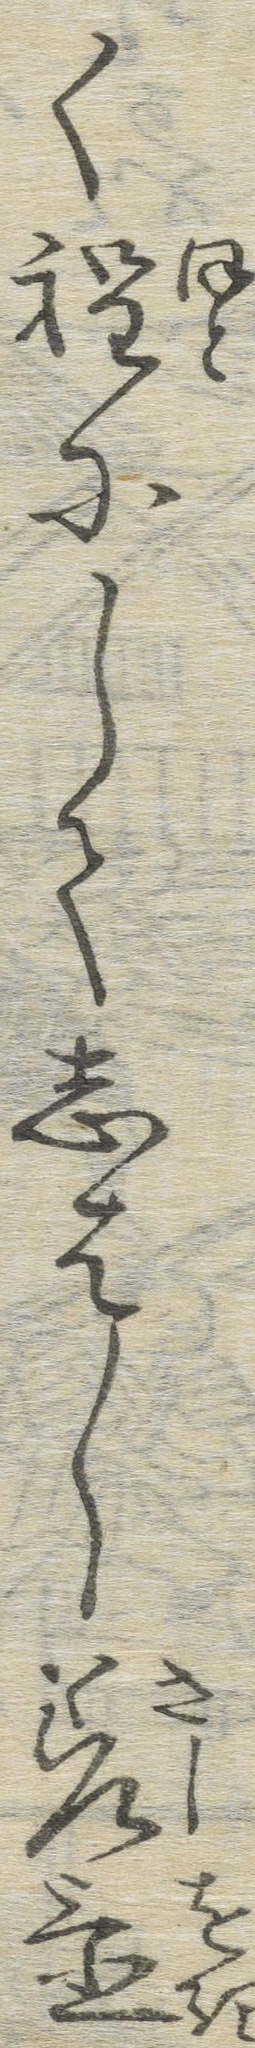く程にしてしはし差置
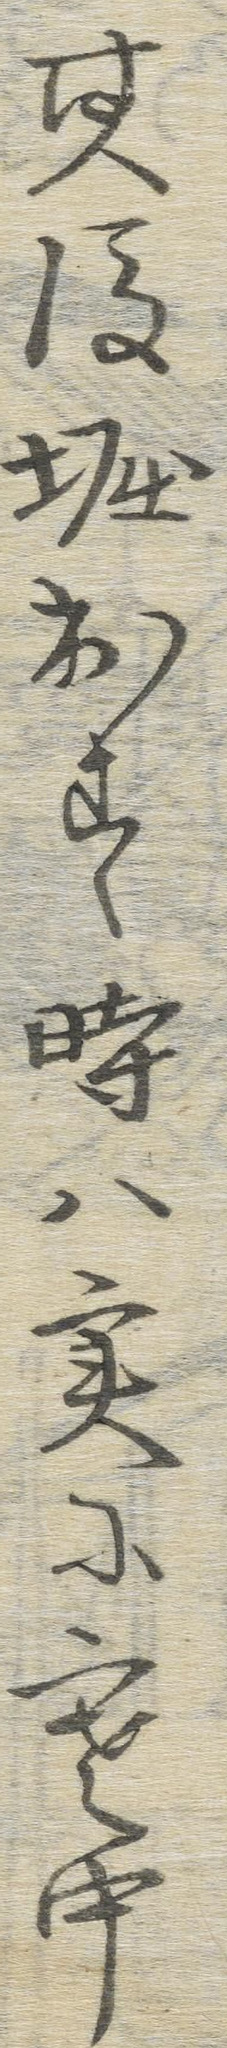其後堀出す時は実に寒中
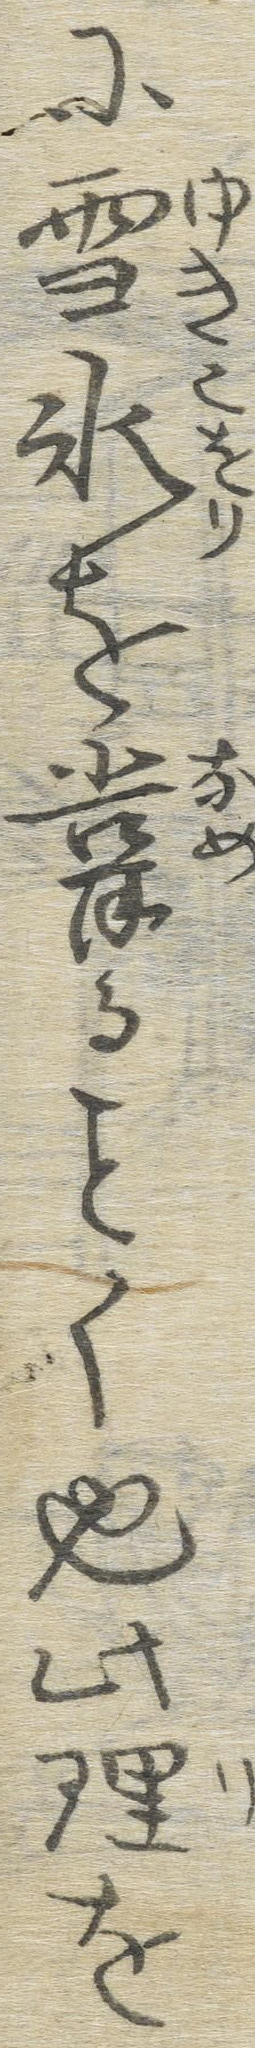に雪氷を嘗ることく也此理を
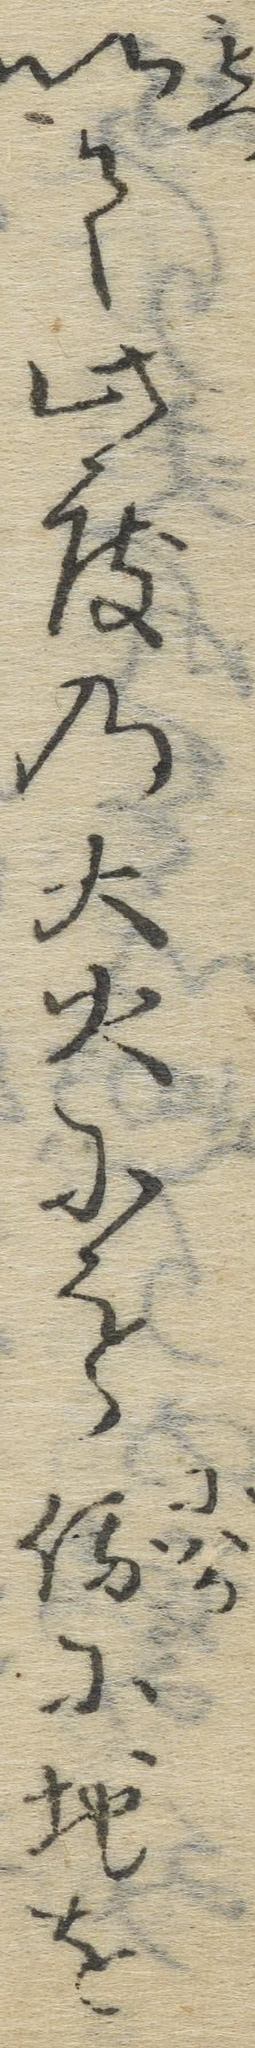以て此度の大火にを俄に地を
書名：あきの日照
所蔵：東京大学地震研究所図書室 Earthquake Research Institute Library, The University of Tokyo, JAPAN
